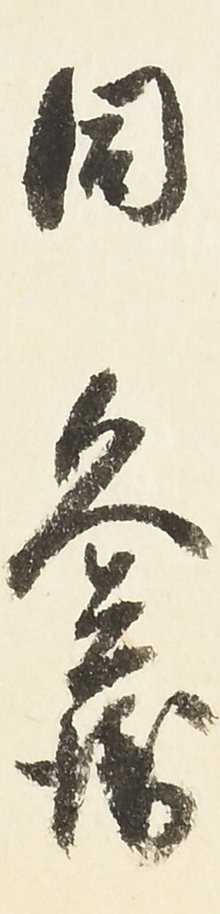同久兵衛
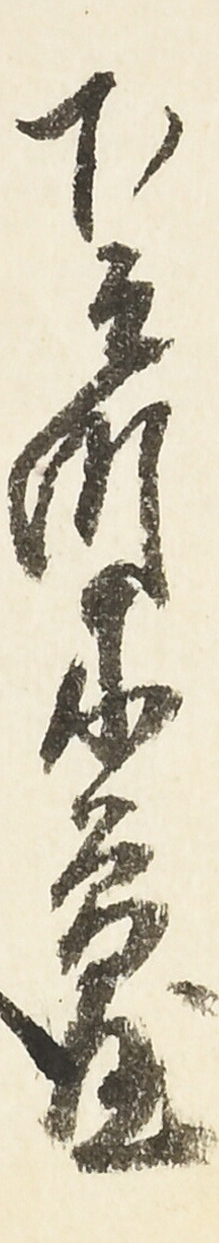下モ町木曽屋
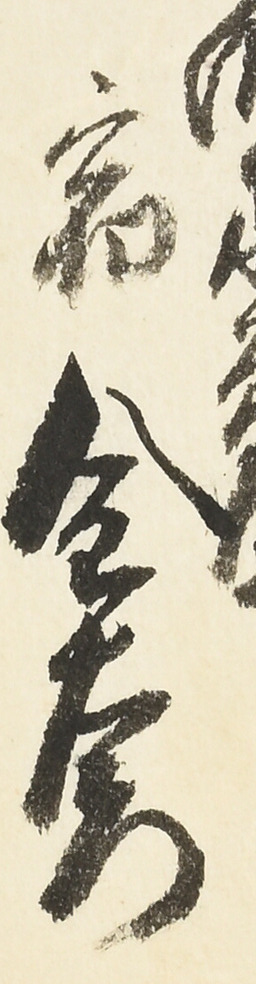宿金右衛門

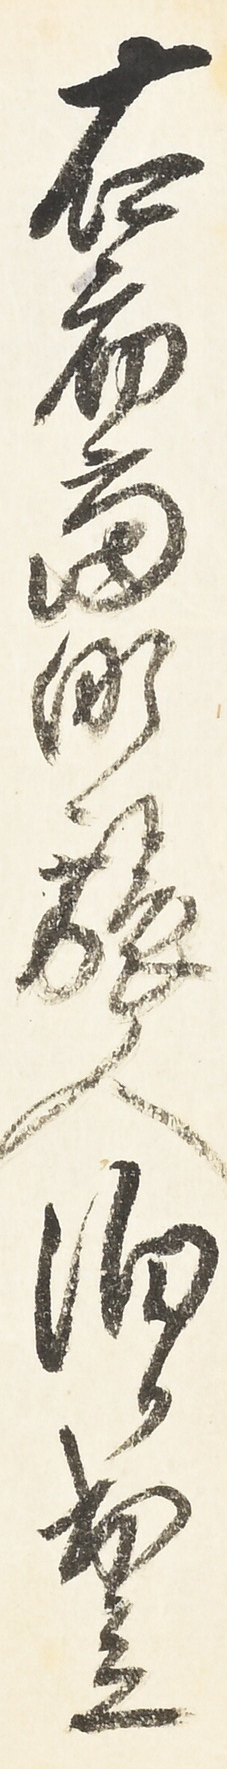右者当町旅人泊出立
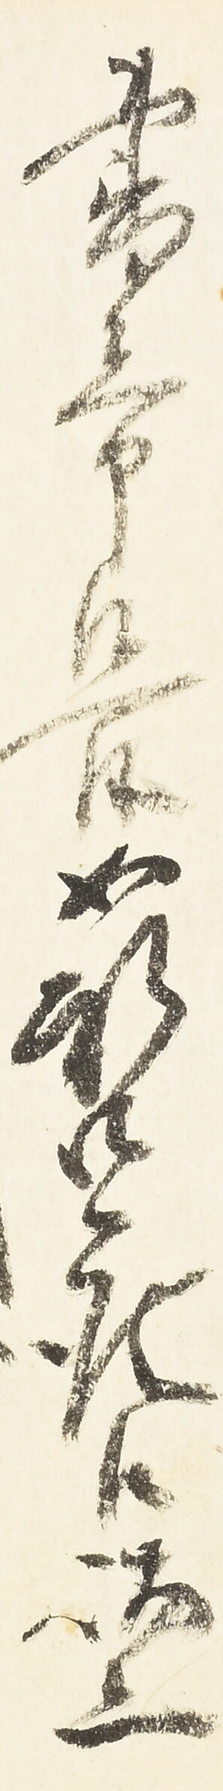書上申候所如斯御座候以上
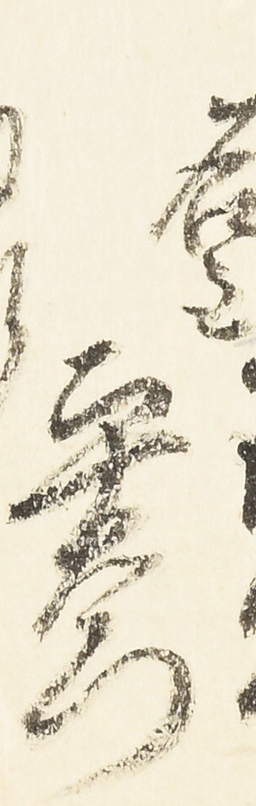平右衛門
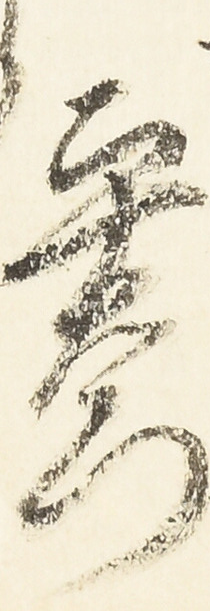平右衛門
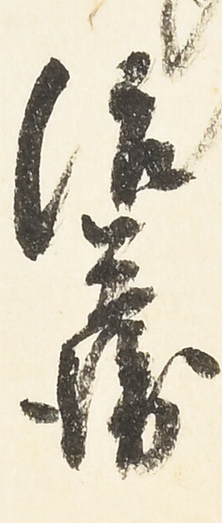治兵衛
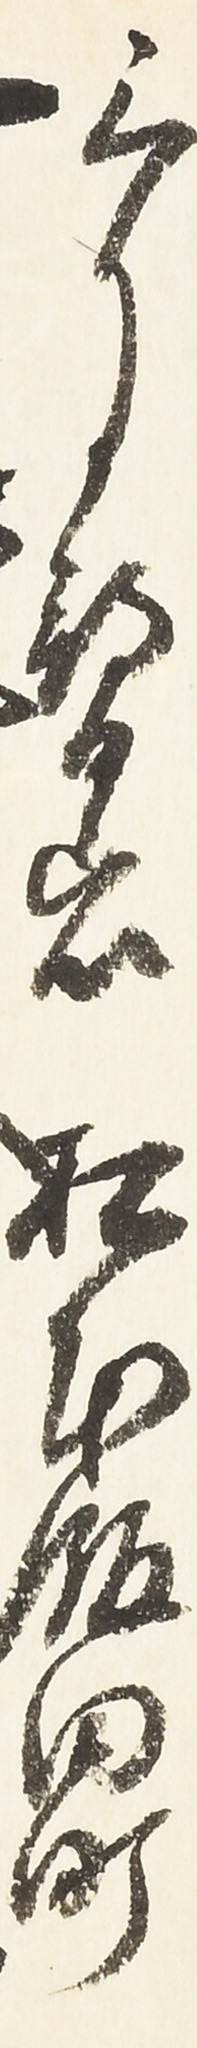三月朔日着松本飯田町
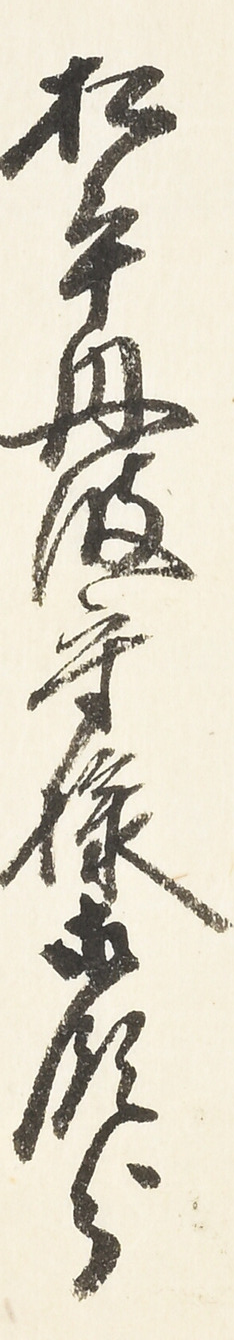松平丹波守様御領分
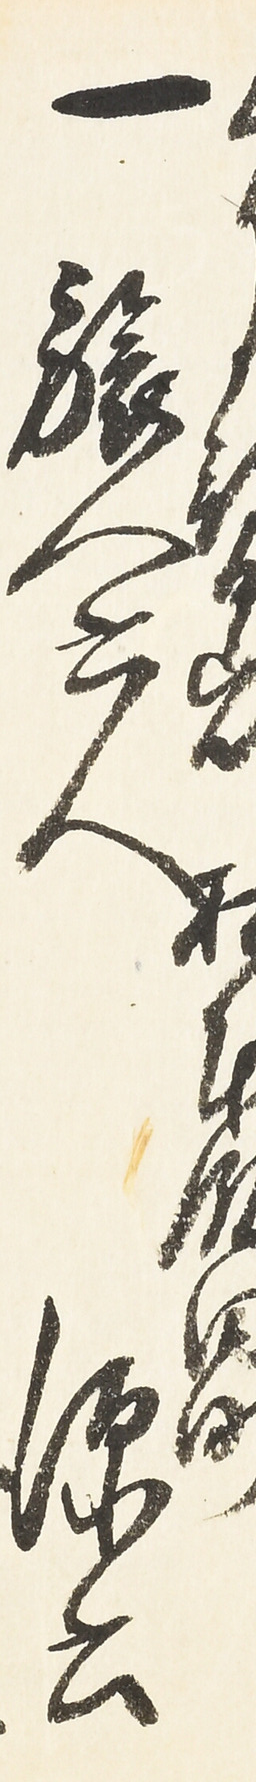一旅人六人源六
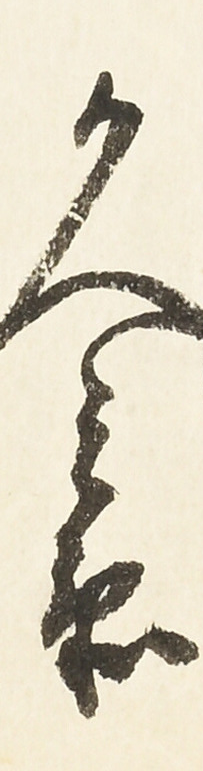久兵衛
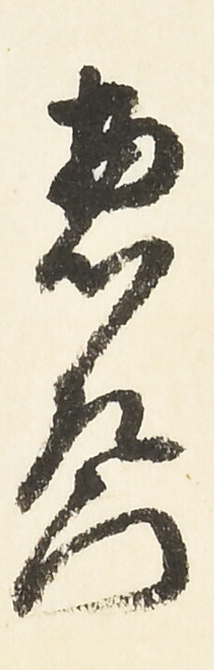惣左衛門
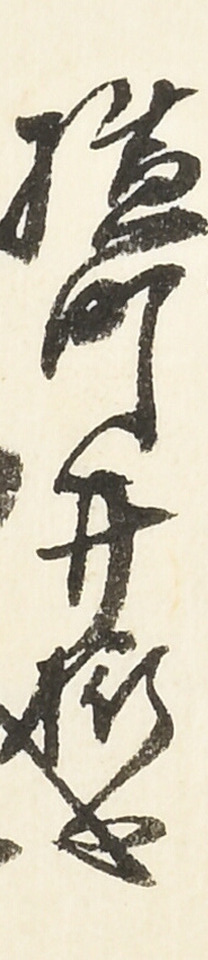横町井桁や
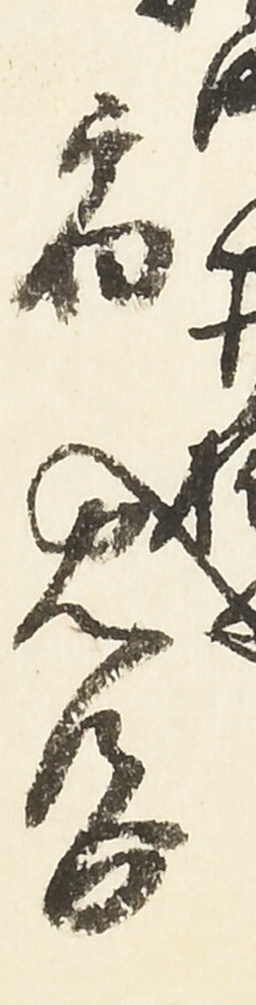宿忠左衛門
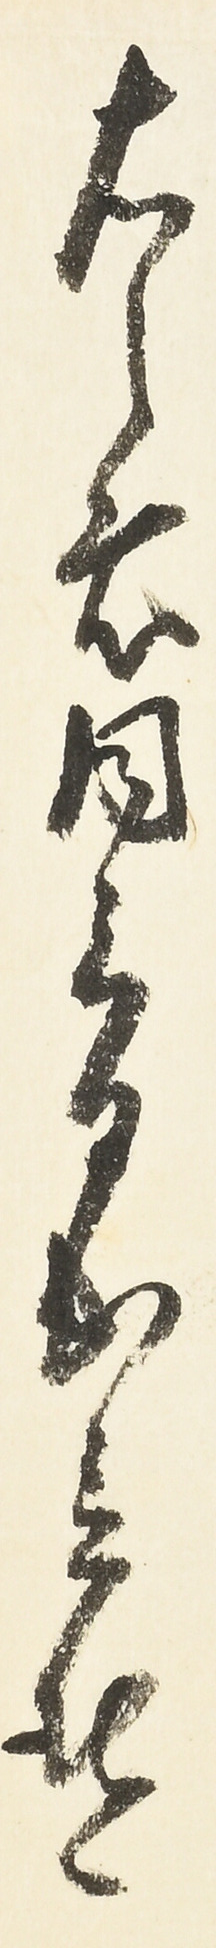右之者同三日出立仕候
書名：町中旅人泊控帳
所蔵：伊那市立高遠町図書館・合同会社AMANE
